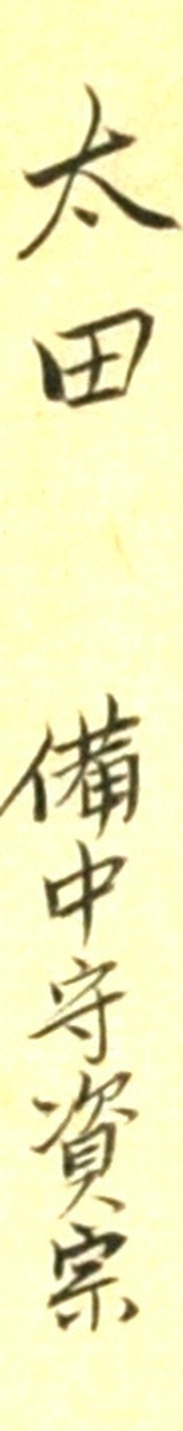太田備中守資宗
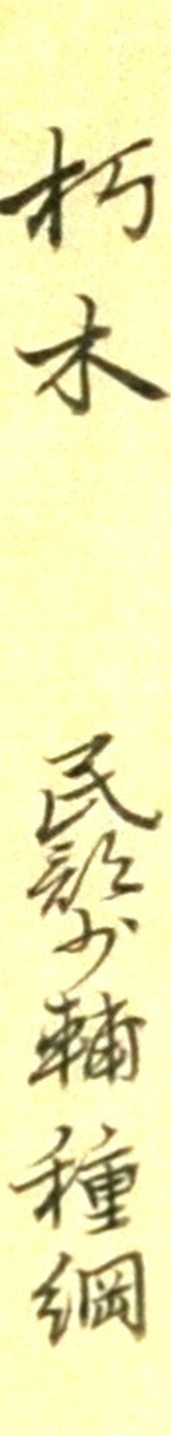朽木民部少輔種綱
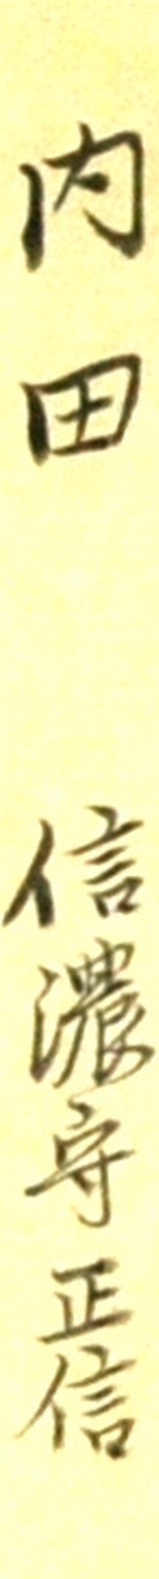内田信濃守正信

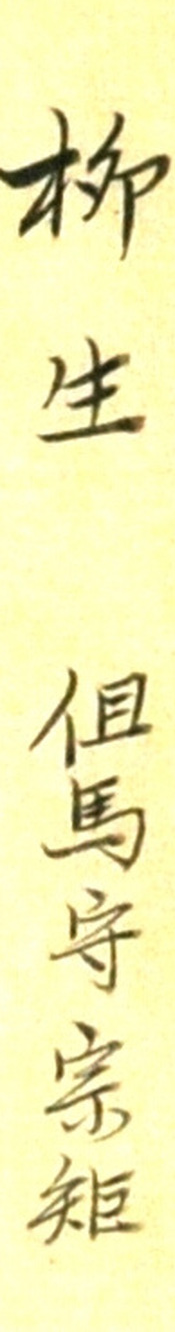柳生但馬守宗矩
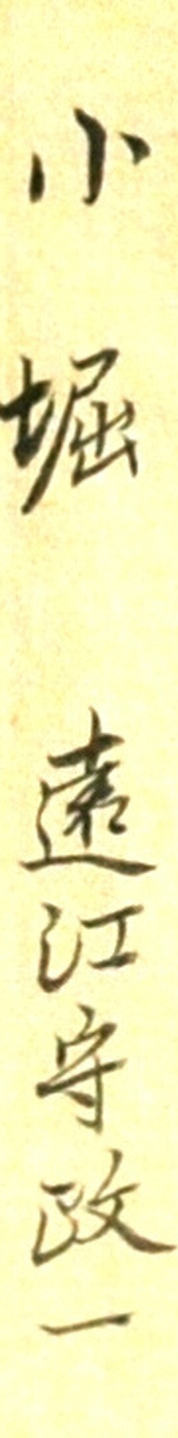小堀遠江守政一
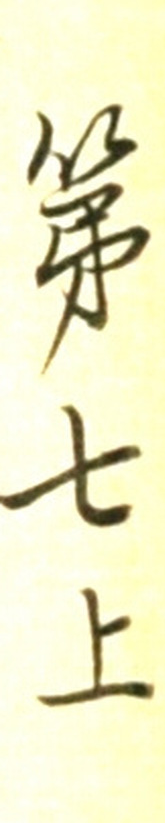第七上
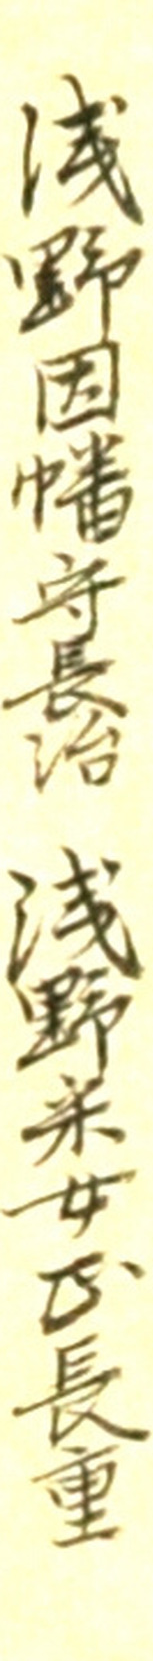浅野浅野因幡守長治浅野采女正長重

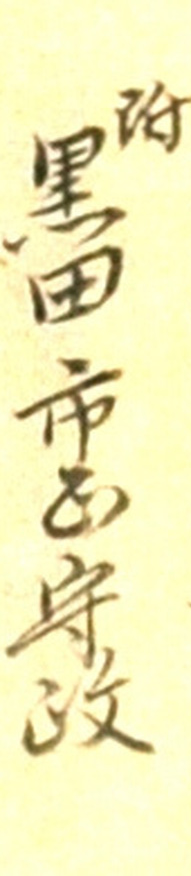黒田附黒田市正守政
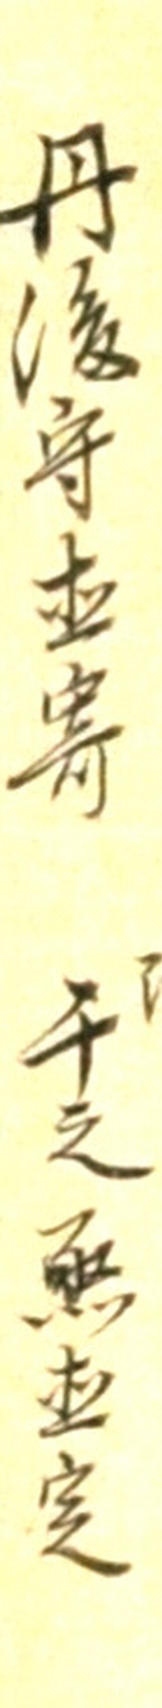堀丹後守直寄附千之丞直定
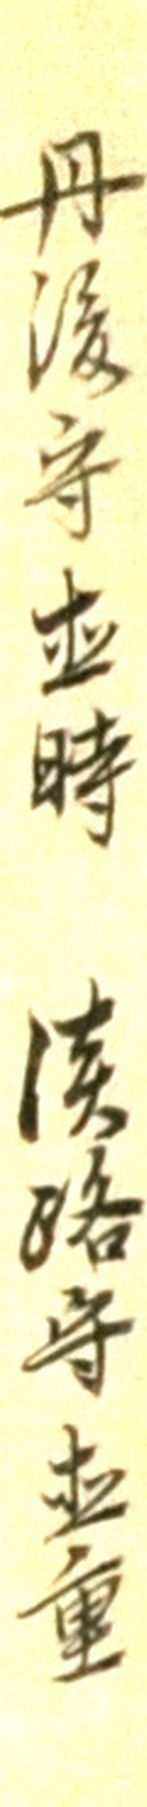丹後守直時淡路守直重
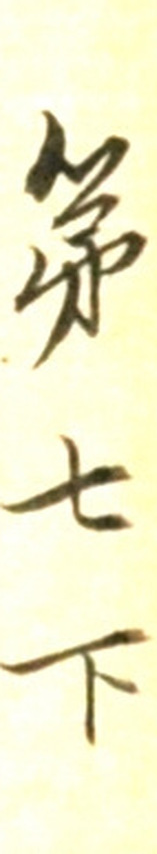第七下
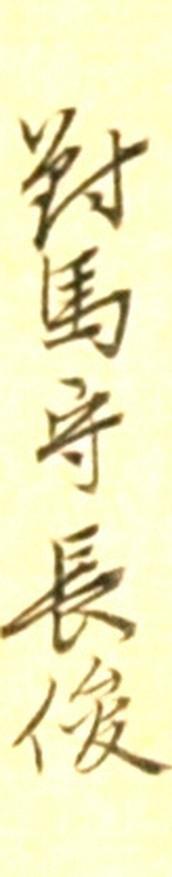対馬守長俊

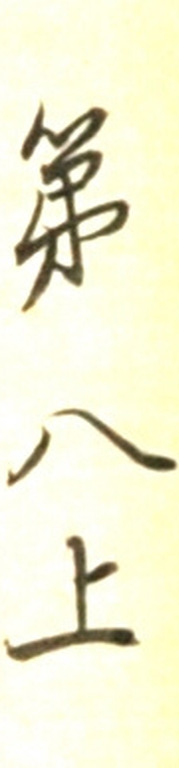第八上

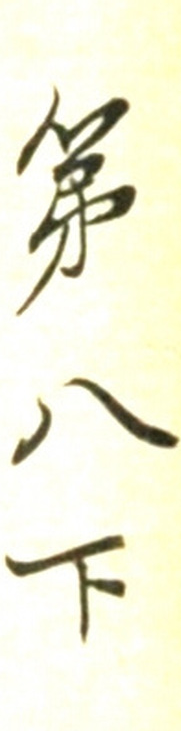第八下

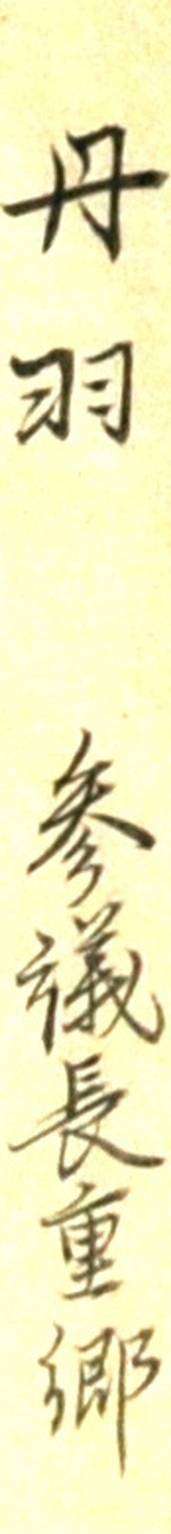丹羽参議長重卿
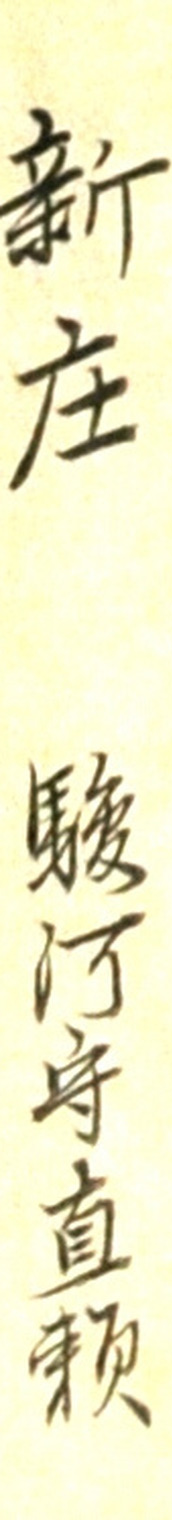新庄駿河守直頼
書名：藩翰譜（一）
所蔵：伊那市立高遠町図書館・合同会社AMANE
